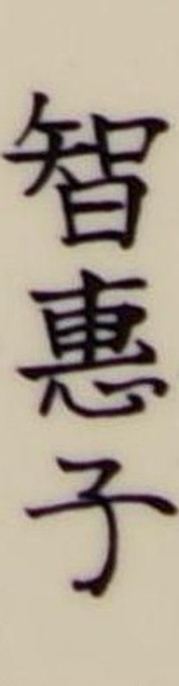智恵子
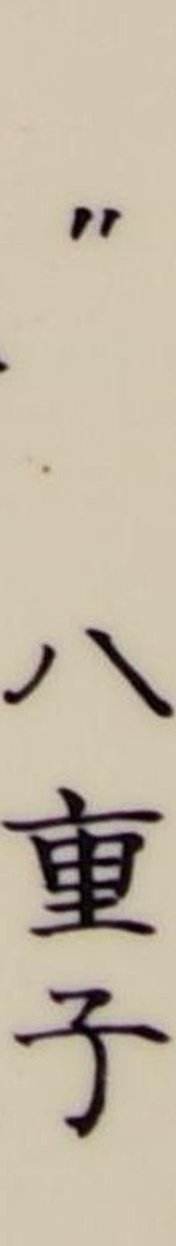八重子
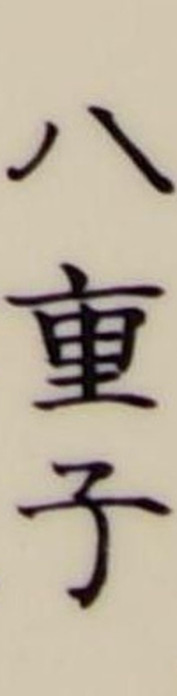八重子
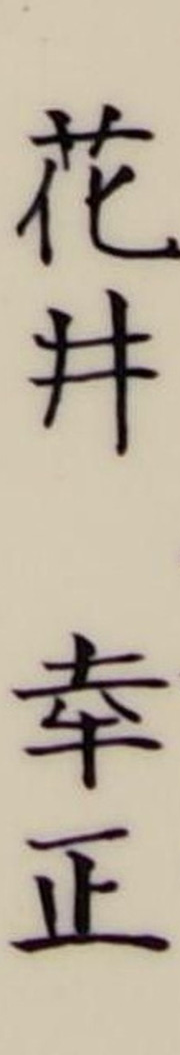花井幸正
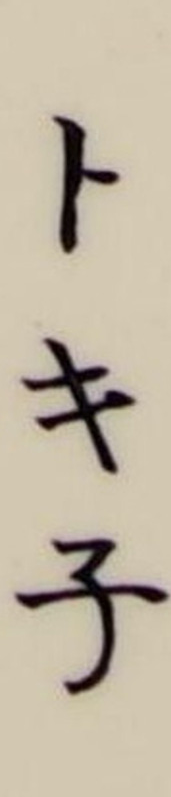トキ子
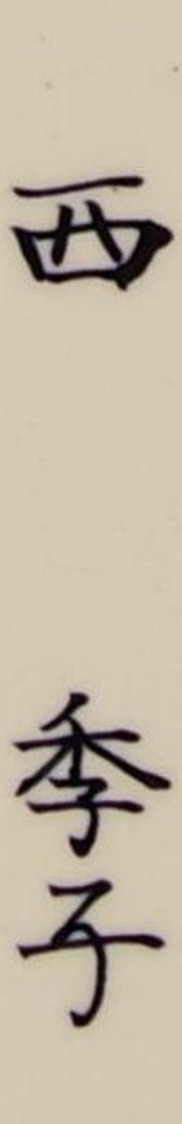西季子
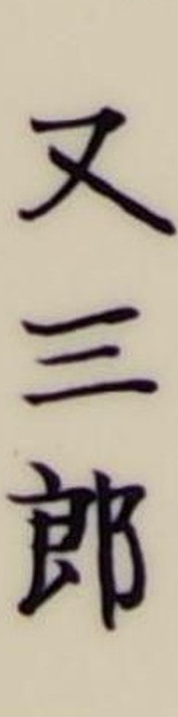又三郎
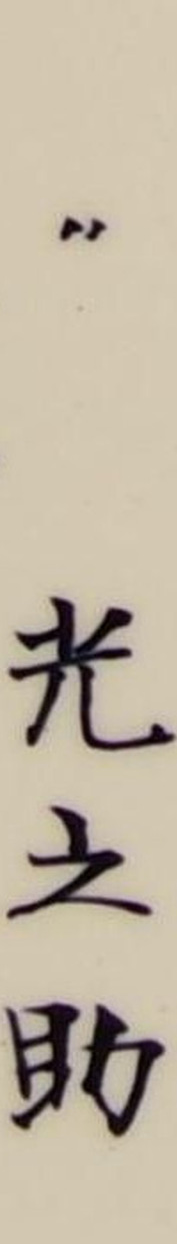光之助
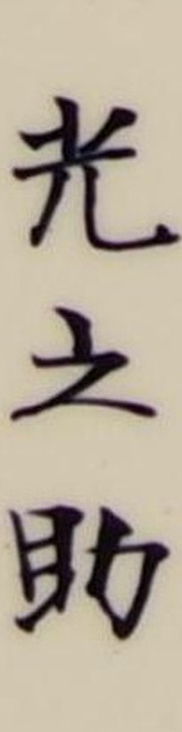光之助
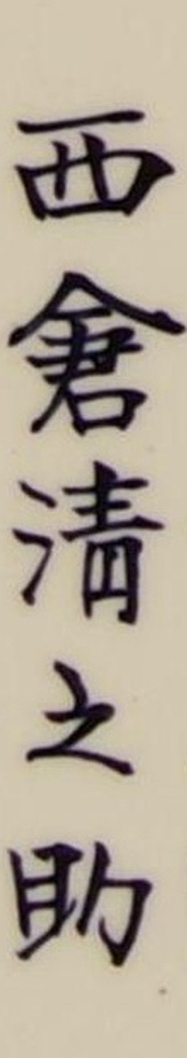西倉清之助
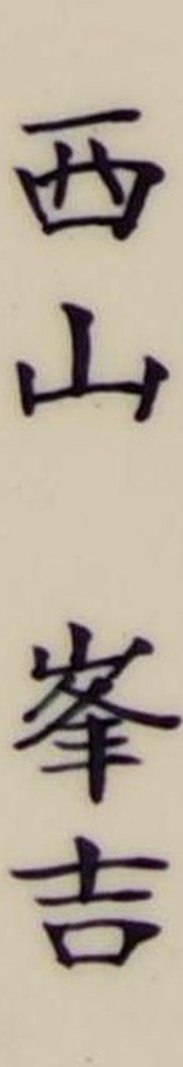西山峯吉
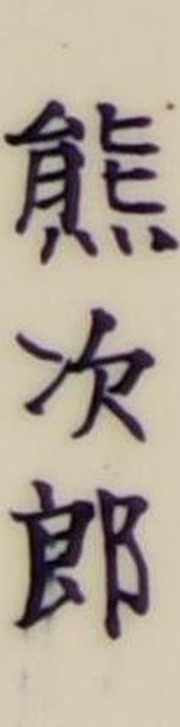熊次郎
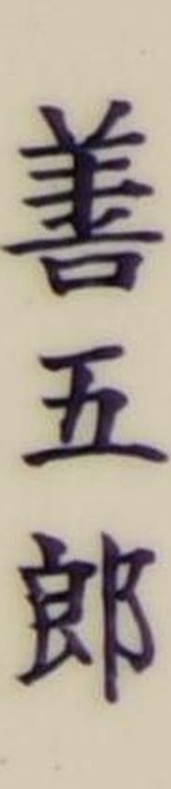善五郎

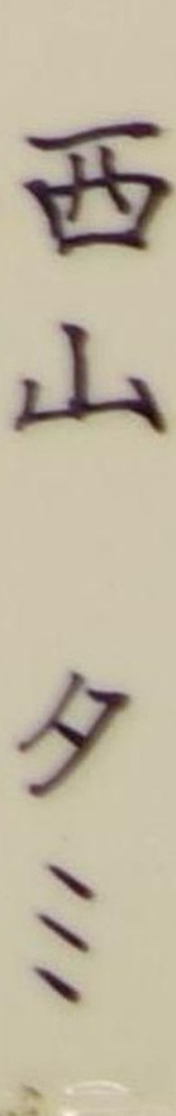西山タミ
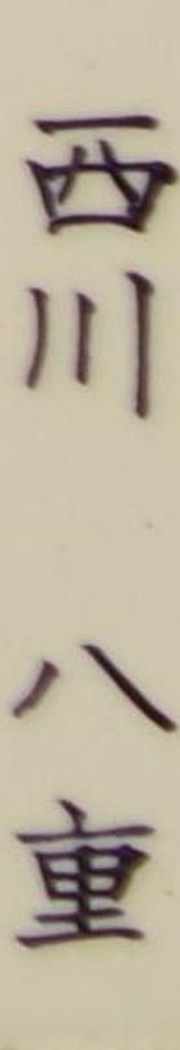西川八重
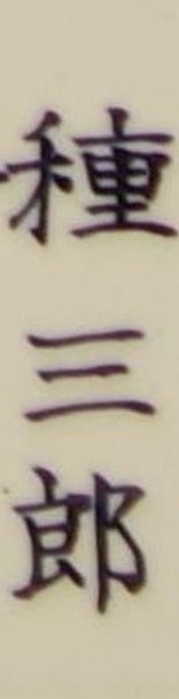種三郎
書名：A~D
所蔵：koyasan kongobuji
